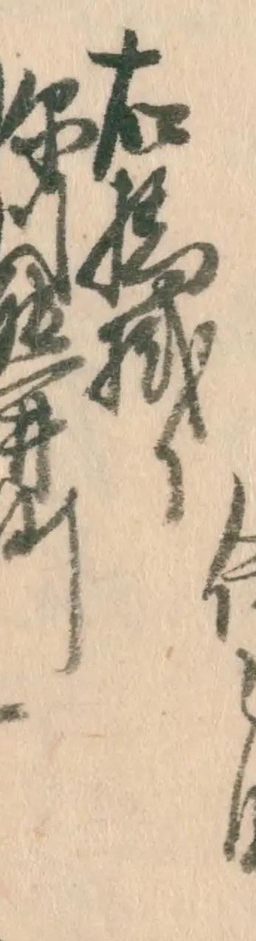右橋掛り
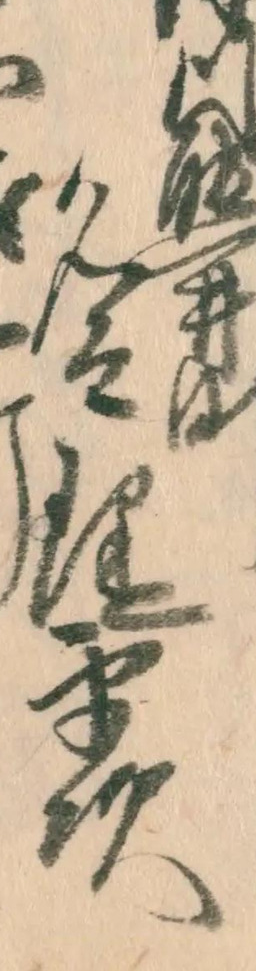名主理平次
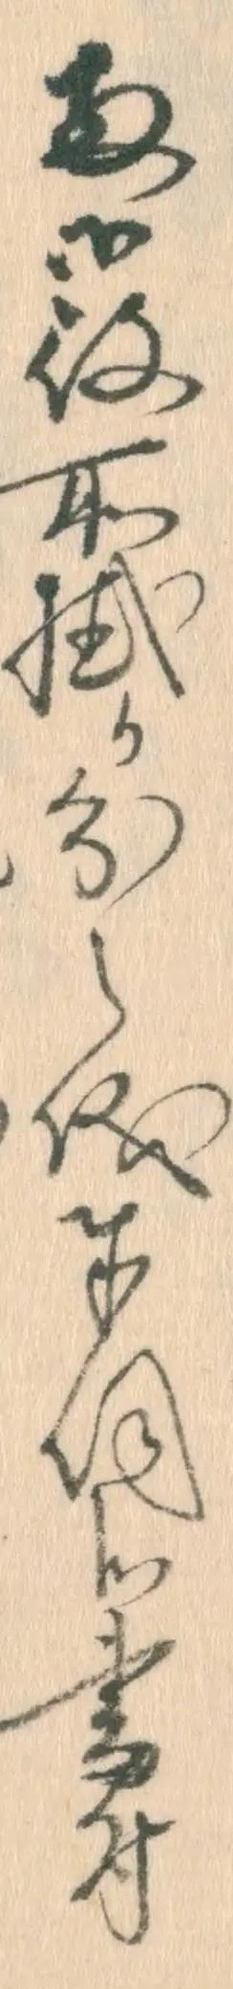両御役所掛り分之儀奉伺候書付
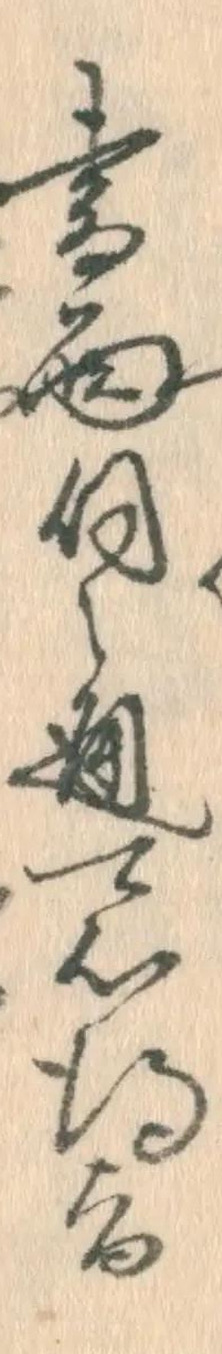書面伺之通可心得旨
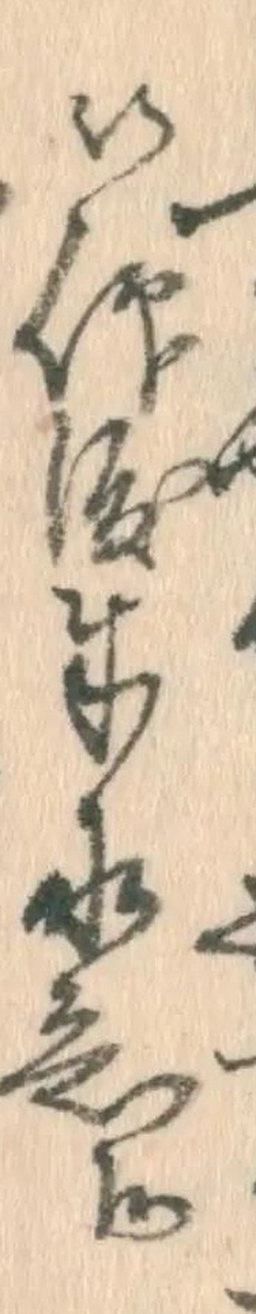被仰渡奉承知候
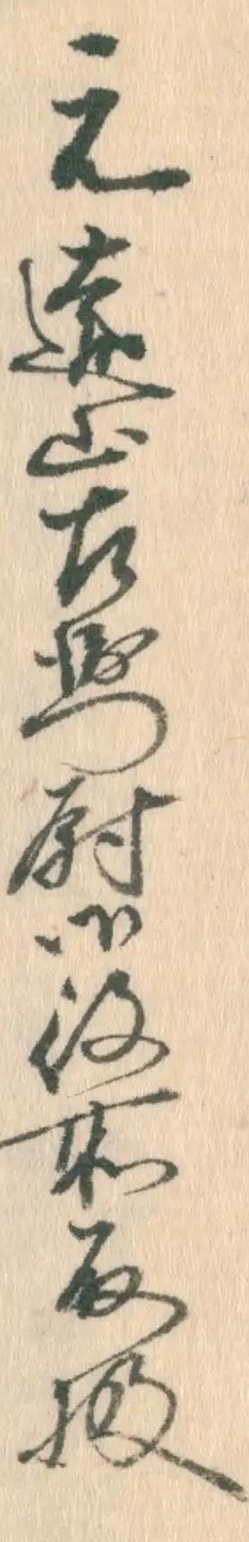元遠山左衛門尉御役所取扱
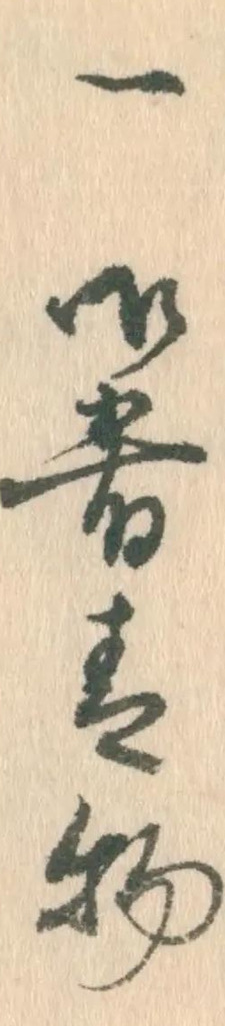一御肴青物
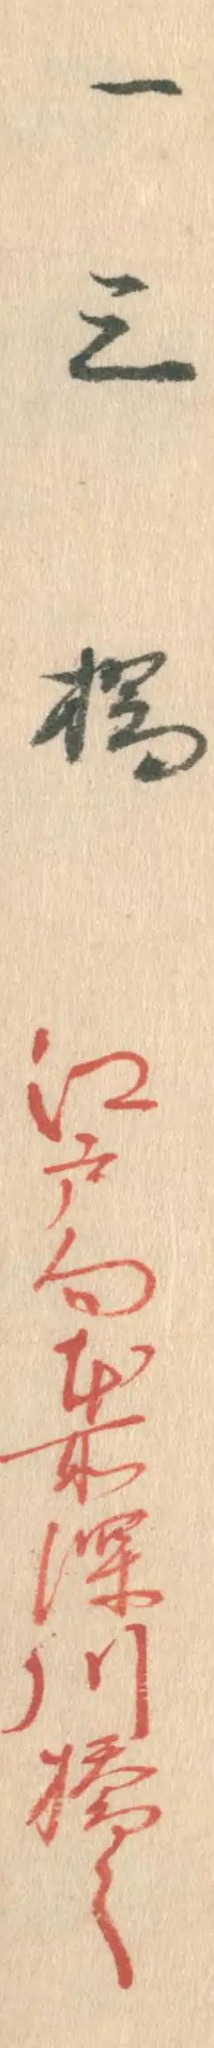一三橋江戸向本所深川橋々

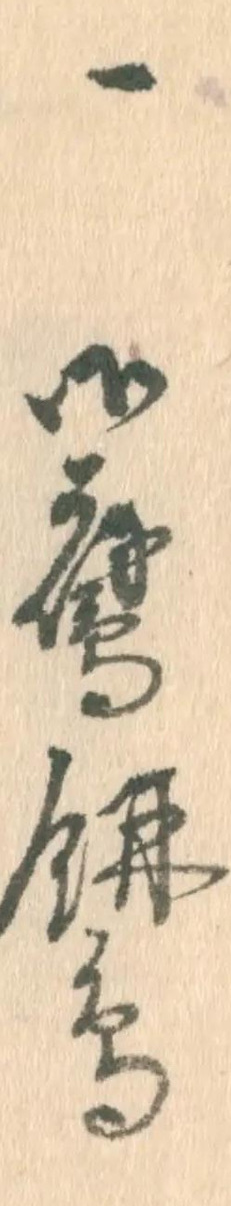一御鷹餌鳥
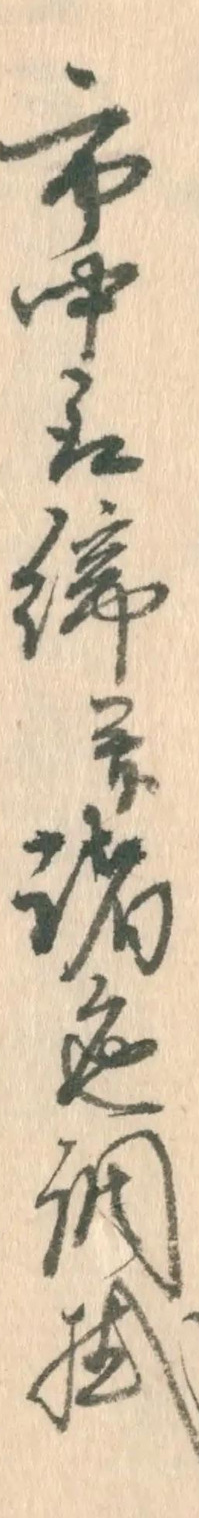一市中取締并諸色調掛
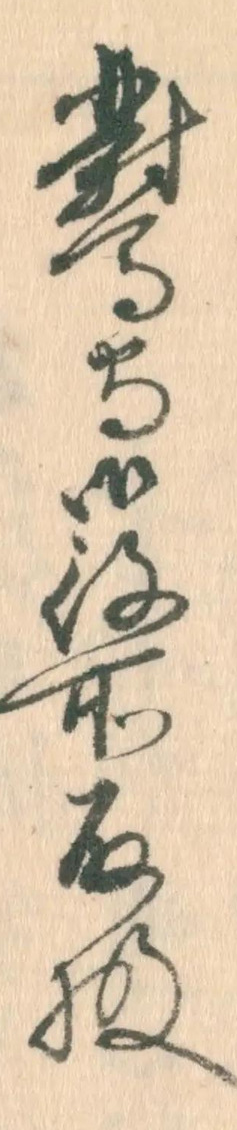対馬守御役所取扱
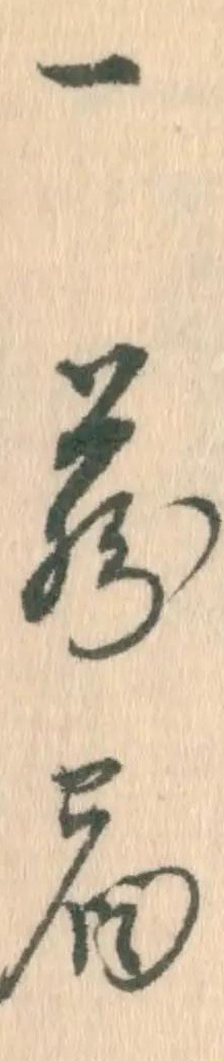一蔵宿
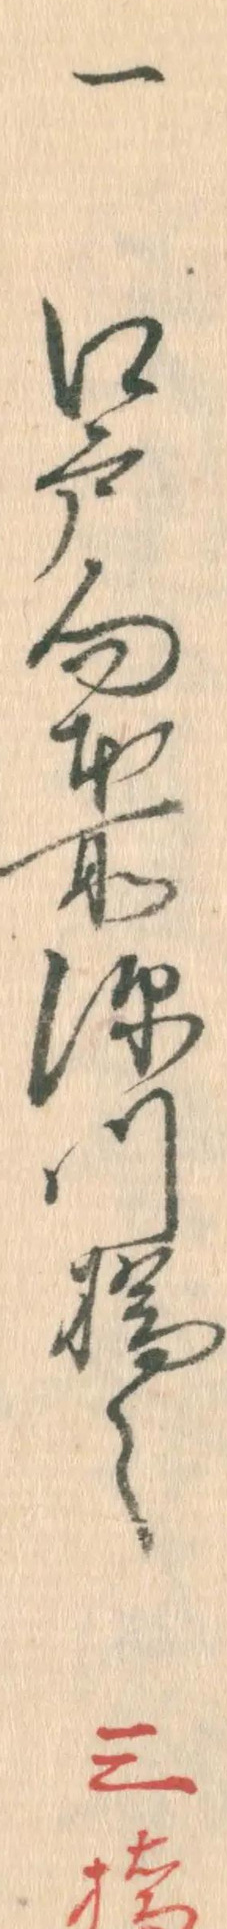一江戸向本所深川橋々三橋
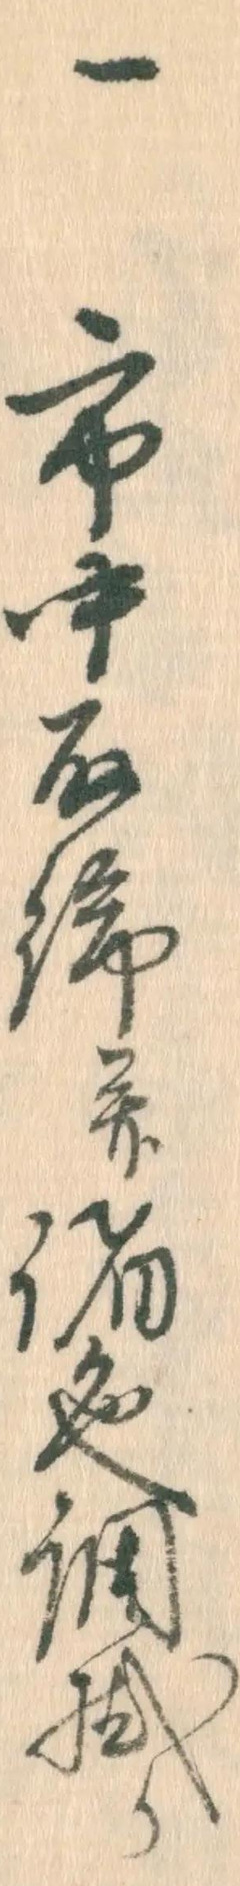一市中取締并諸色調掛り
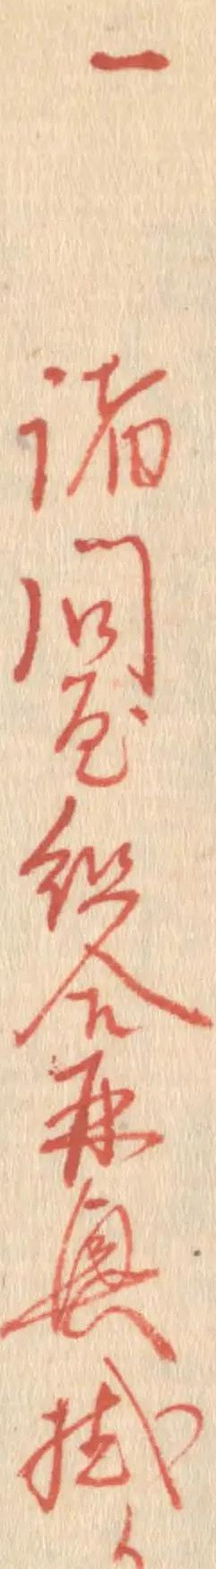一諸問屋組合再興掛り
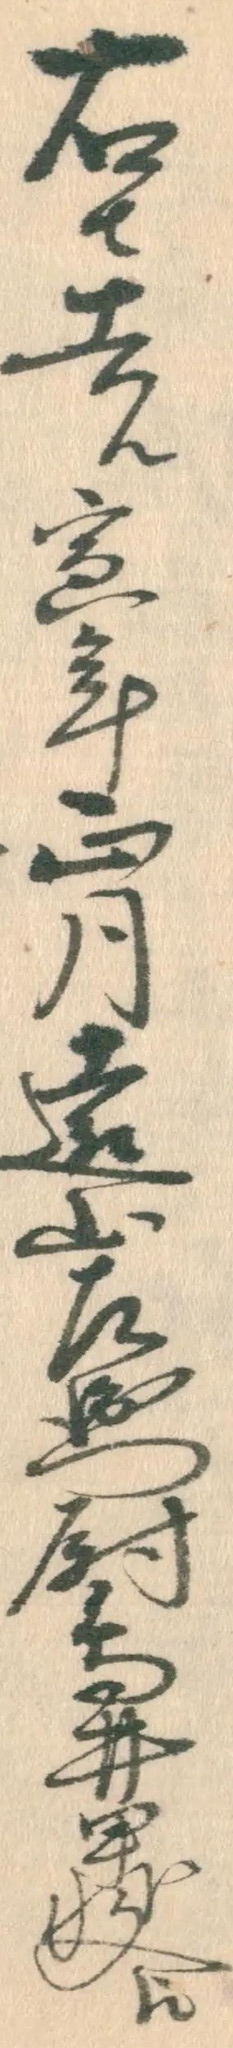右は去ル寅年正月遠山左衛門尉鳥井甲斐え
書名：三橋 17巻. [7] 三橋小破御修復書留　但御奉行御掛リ替地震潰橋番屋　嘉永四亥年より安政二卯年迄　上
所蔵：国立国会図書館 National Diet Library, JAPAN
